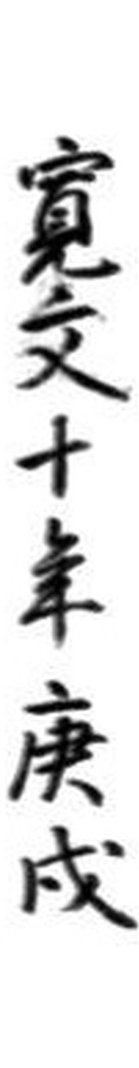寛文十年庚戌
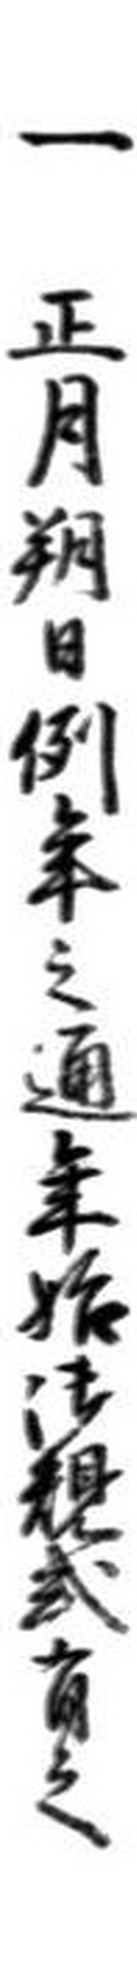一正月朔日例年之通年始御規式有之
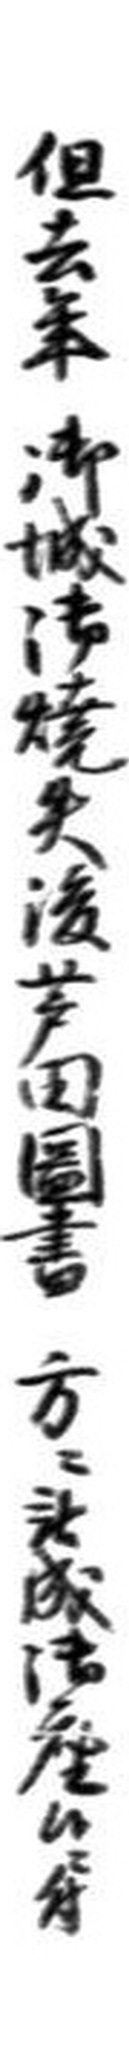但去年御城御焼失後芦田図書方ニ被成御座候ニ付
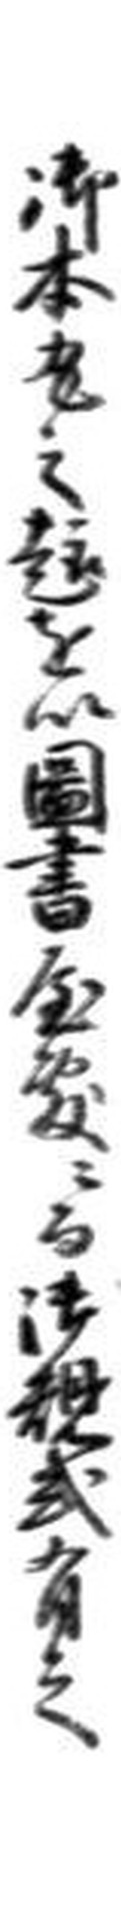御本丸之趣を以図書屋敷ニ而御規式有之
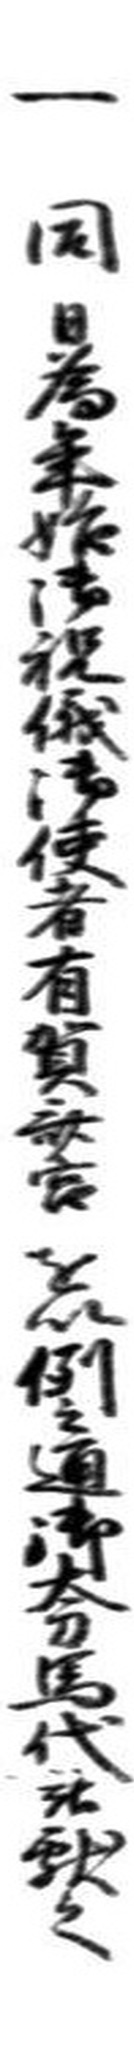一同日為年始御祝儀御使者有賀斎宮を以例之通御太刀馬代被献之
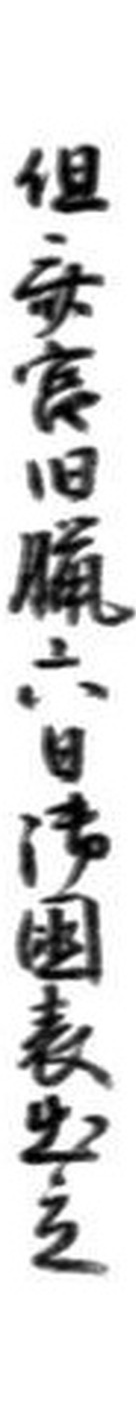但斎宮旧臘六日御国表出立
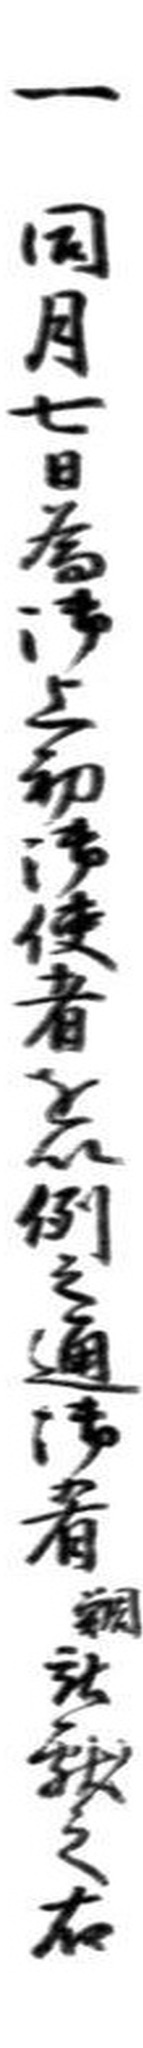一同月七日為御上初御使者を以例之通御肴鯛被献之右
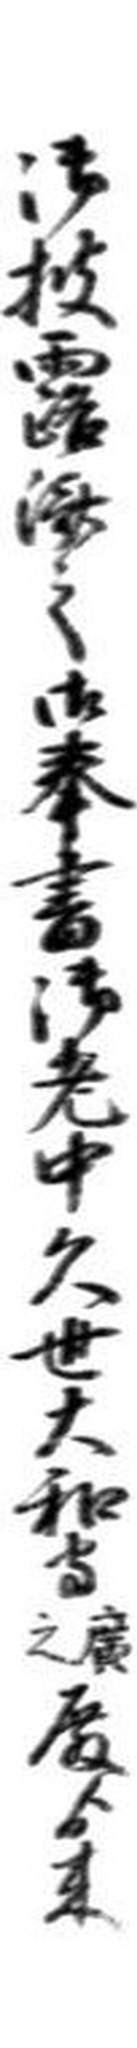御披露済之御奉書御老中久世大和守広之殿ゟ来
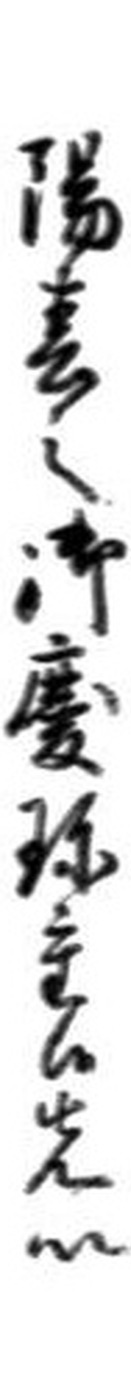陽春之御慶珎重候先以

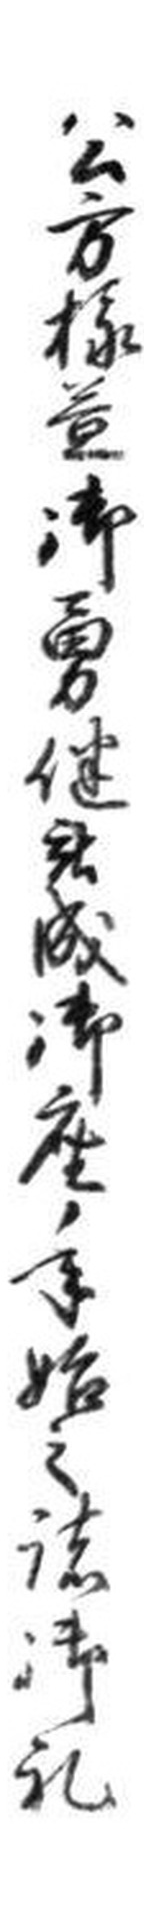公方様益御勇健被成御座年始之諸御礼
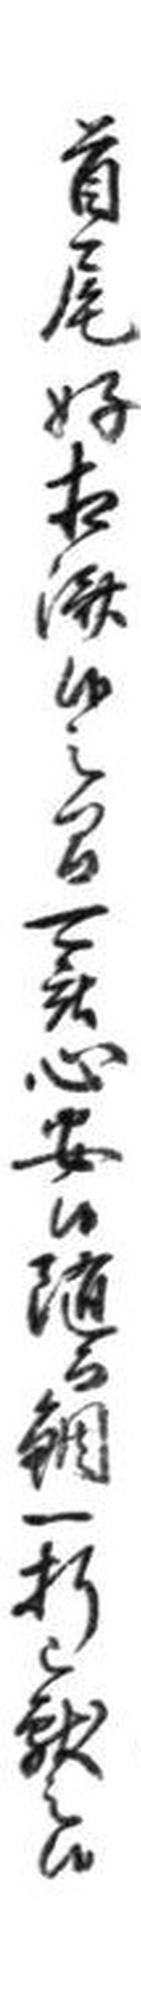首尾好相済候之間可被心安候随而鯛一折被献之候
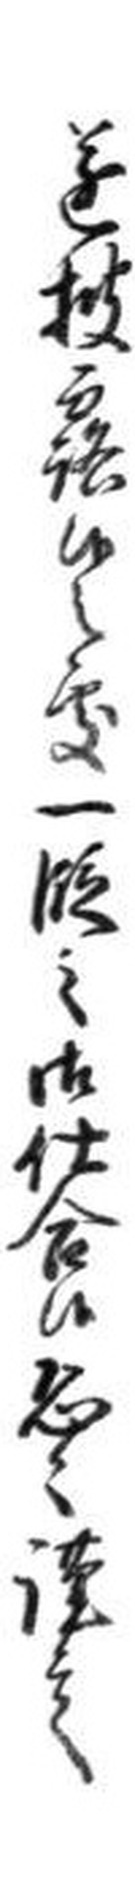遂披露候之処一段之御仕合候恐々謹言
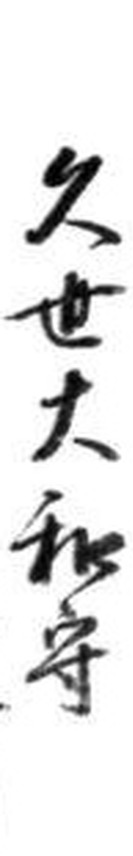久世大和守
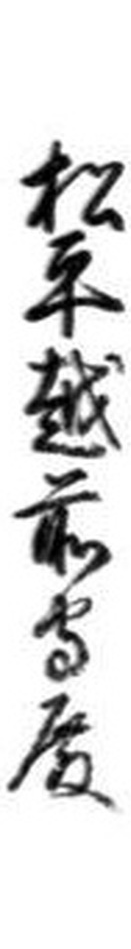松平越前守殿
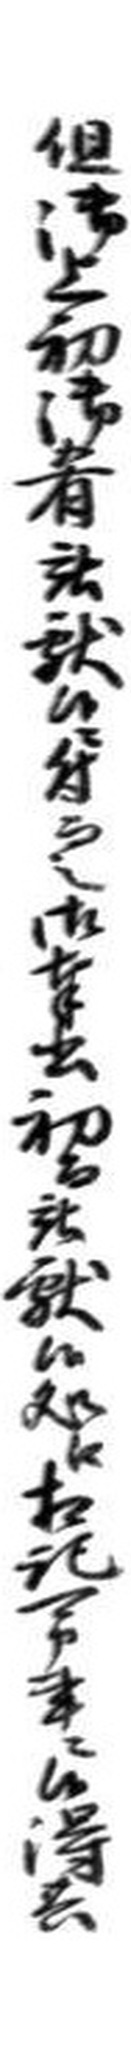但御上初御肴被献候ニ付而之御奉書初而被献候処江相記可申事ニ候得共
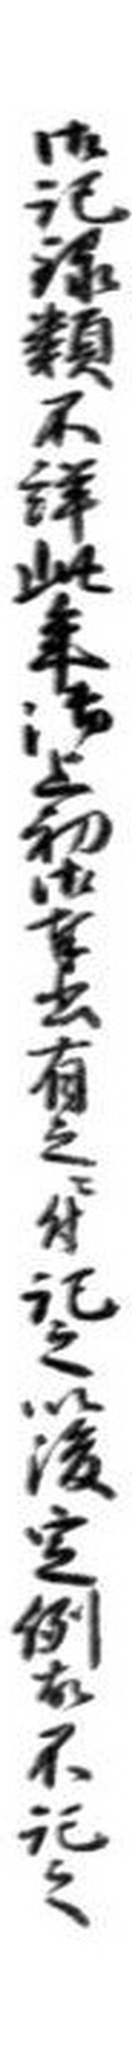御記録類不詳此年御上初御奉書有之ニ付記之以後定例故不記之
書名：家譜 八 光通公 従寛文十年到同十二年
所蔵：福井県文書館 Fukui Prefectural Archives
